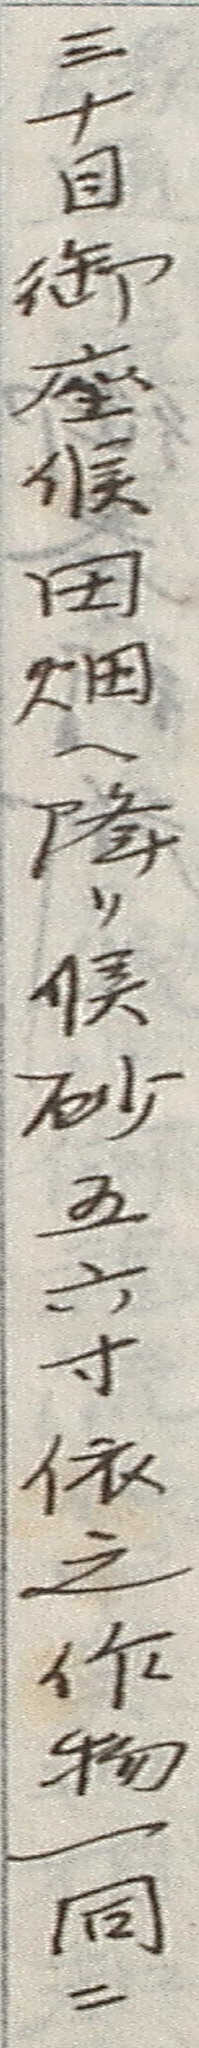三十目御座候田畑へ降り候砂五六寸依之作物一同ニ
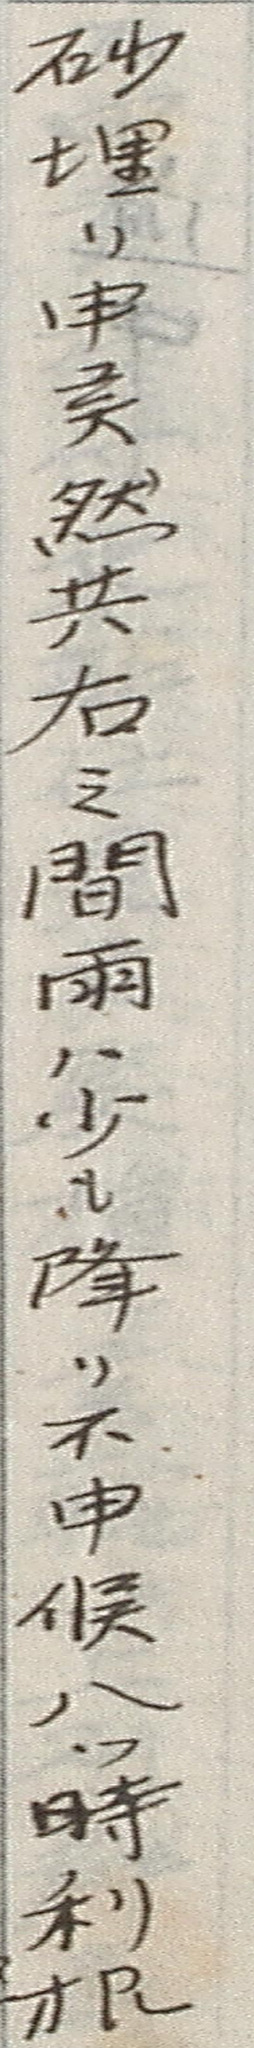砂埋り申候然共右之間雨ハ少も降り不申候八ツ時利根
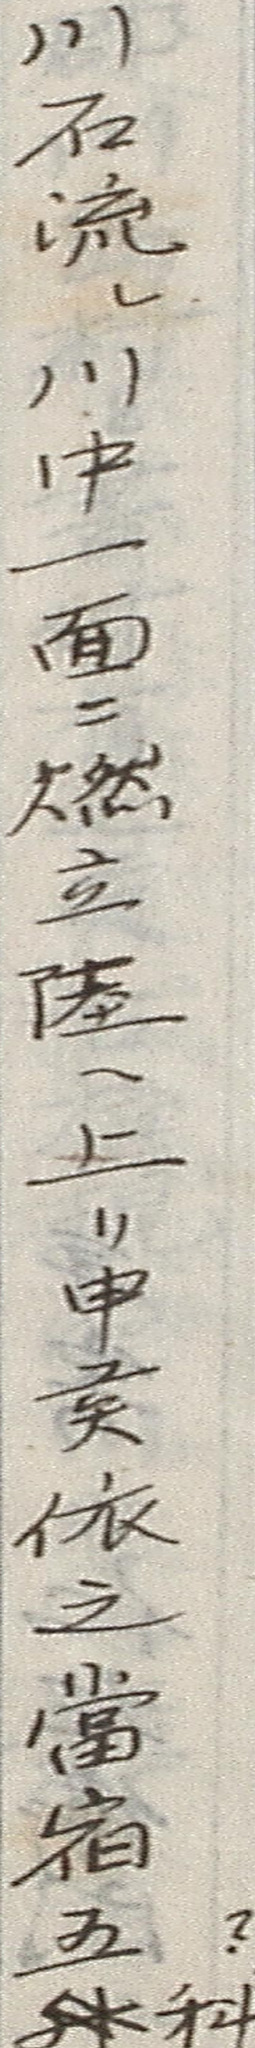川石流レ川中一面ニ燃立陸へ上り申候依之當宿五？科
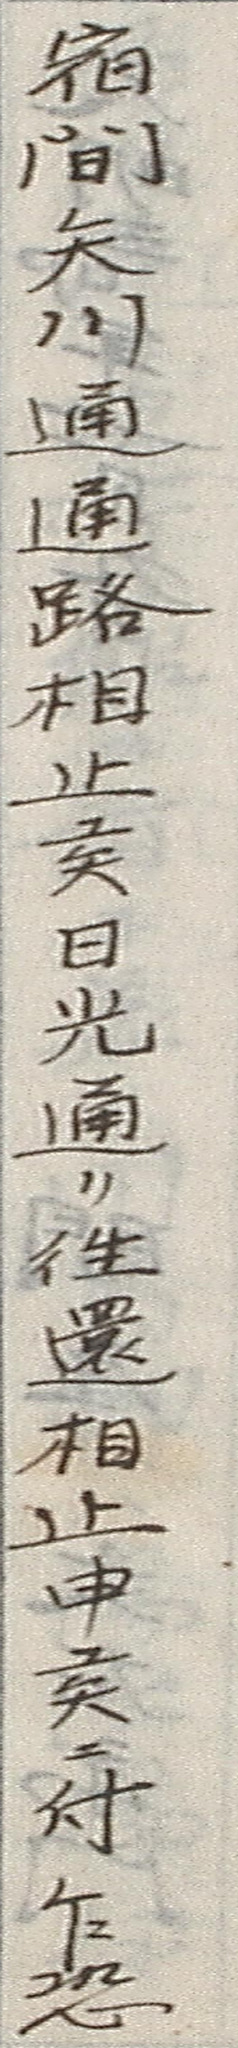宿間矢川通通路相止候日光通り往還相止申候ニ付乍恐
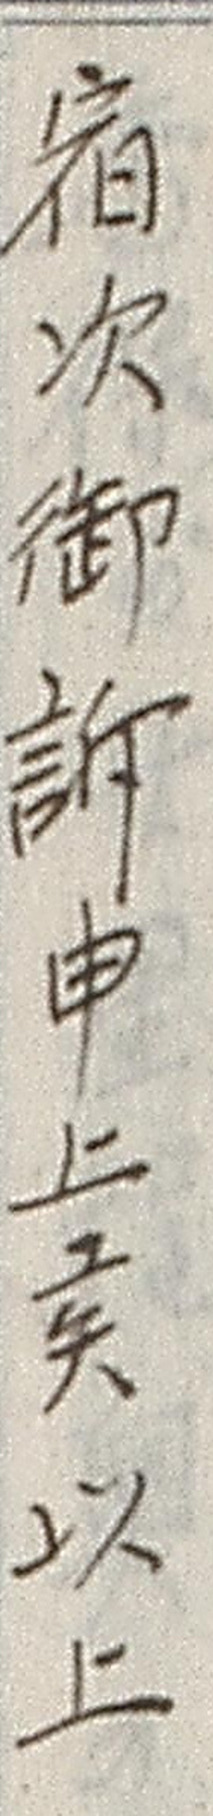宿次御訴申上候以上
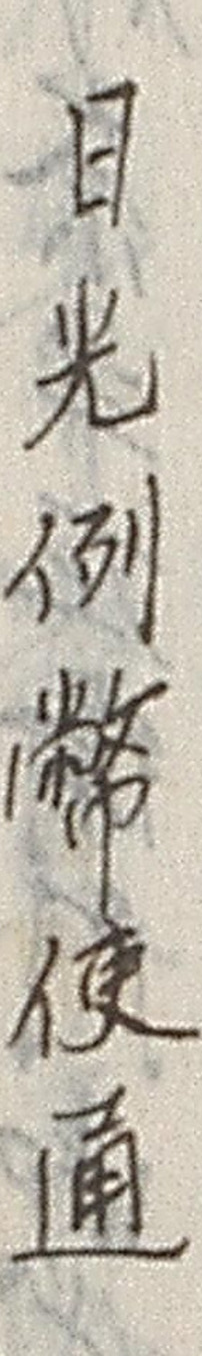日光例幣使通
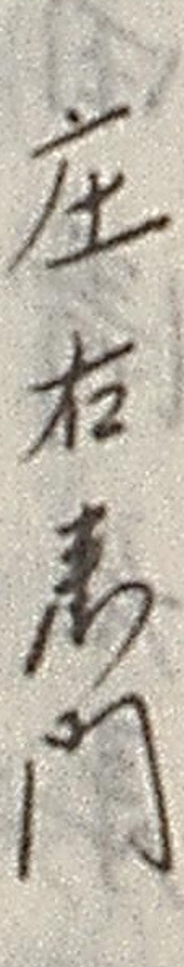庄右衛門
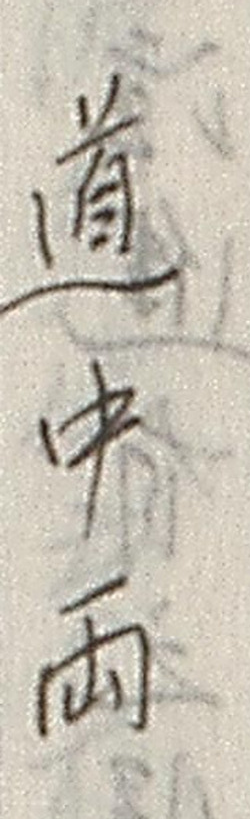道中兩
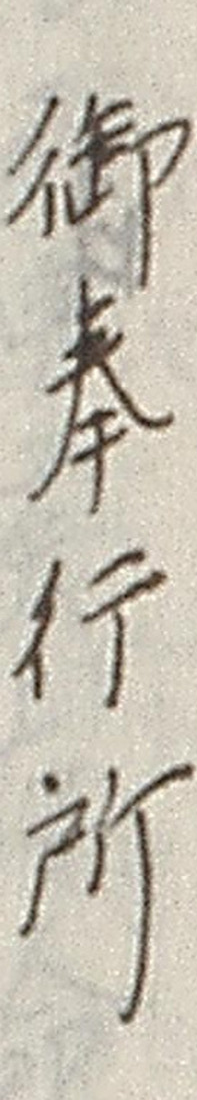御奉行所
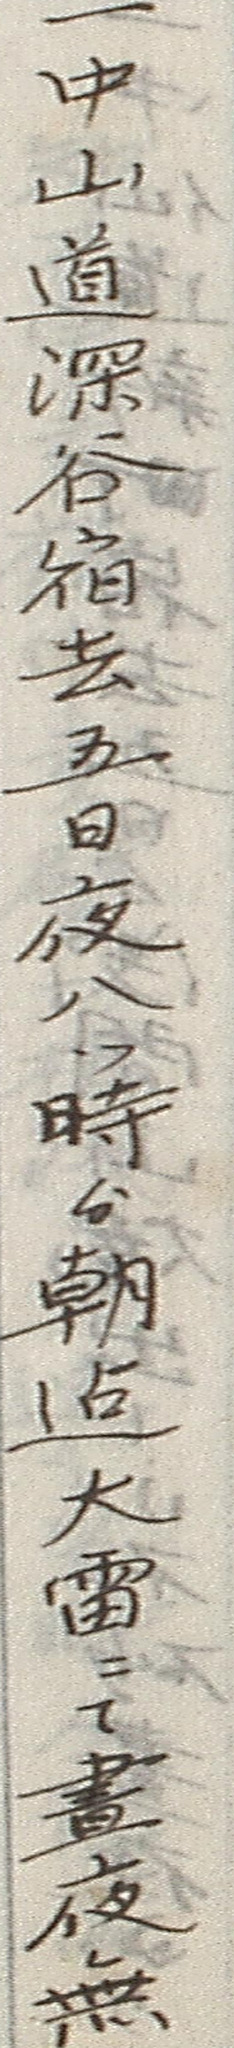一中山道深谷宿去五日夜八ッ時ゟ朝迄大雷二て晝夜無
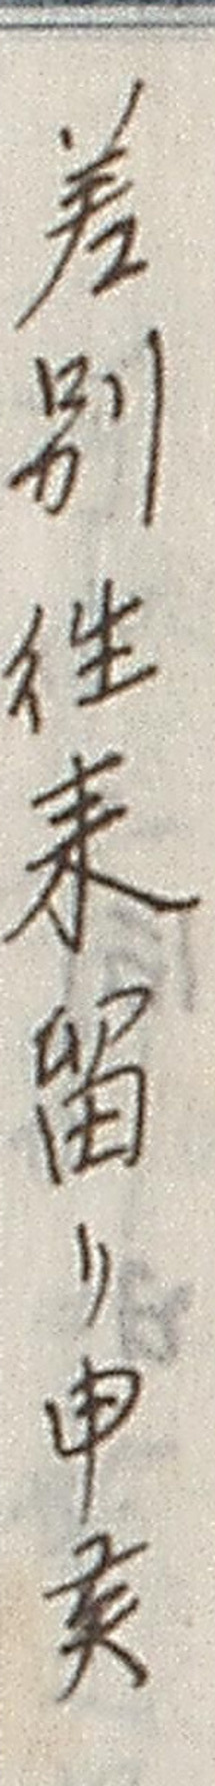差別往来留り申候
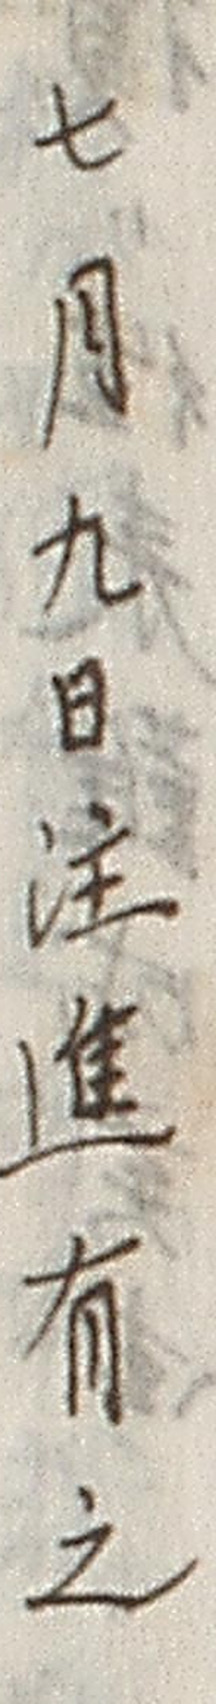七月九日注進有之
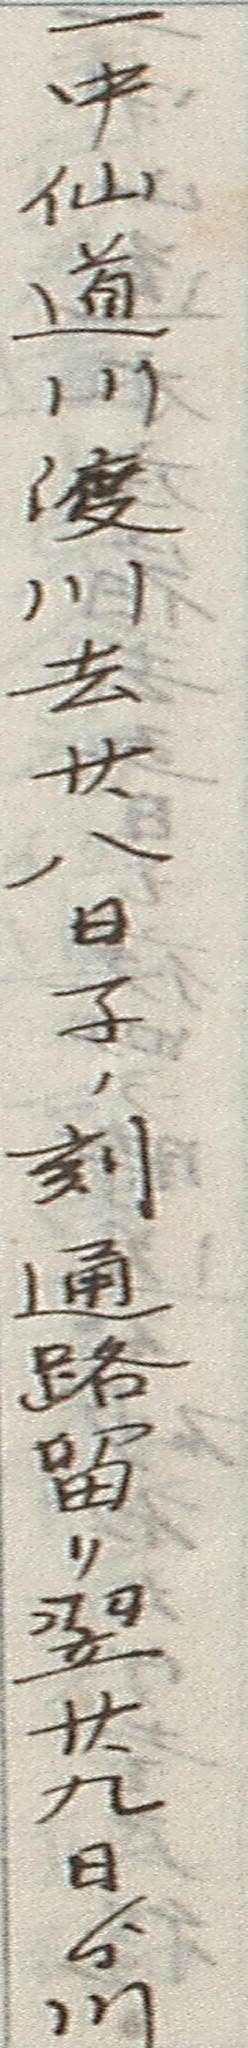一中仙道川渡川去廿八日子ノ刻通路留り翌廿九日ゟ川
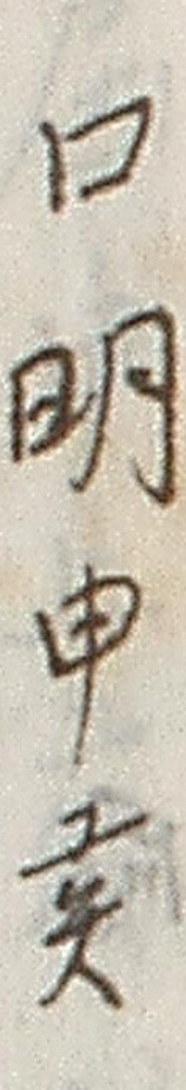口明申候

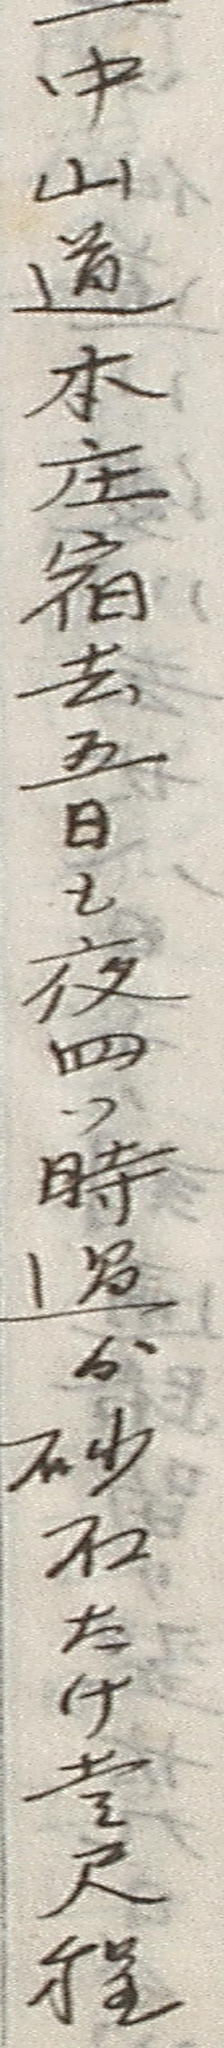一中山道本庄宿去五日も夜四ツ時過ゟ砂石たけ壱尺程
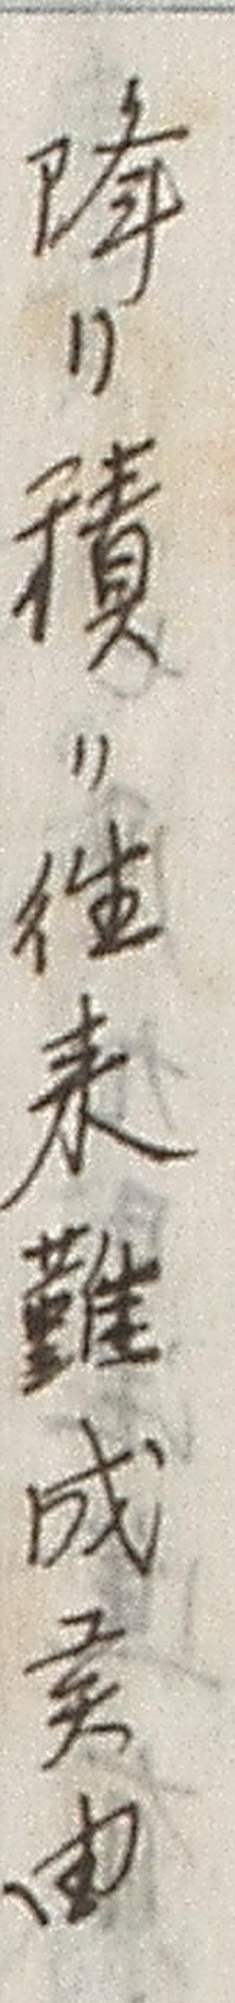降リ積リ往来難成候由
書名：浅間山焼出記
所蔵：東京大学地震研究所図書室 Earthquake Research Institute Library, The University of Tokyo, JAPAN
